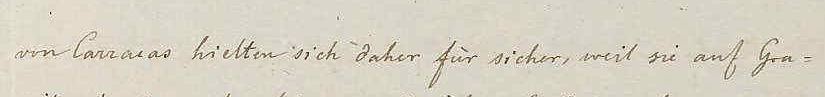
von Carracas hielten sich daher für sicher, weil sie auf Gra-
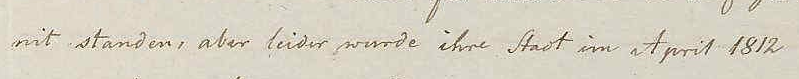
nit standen, aber leider wurde ihre Stadt im April 1812
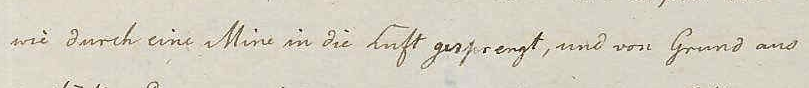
wie durch eine Mine in die Luft gesprengt, und von Grund aus
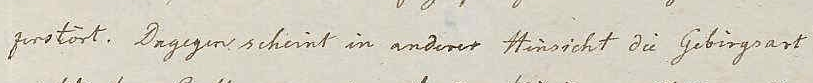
zerstört. Dagegen scheint in anderer Hinsicht die Gebirgsart
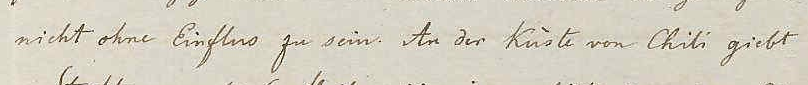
nicht ohne Einflus zu sein. An der Küste von Chili giebt
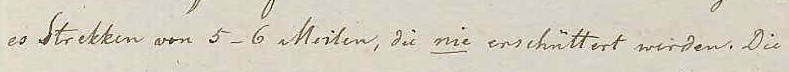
es sStrekken von 5–6 Meilen, die nie erschüttert werden. Die
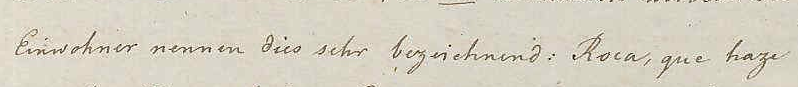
Einwohner nennen dies sehr bezeichnend: Roca, que haze
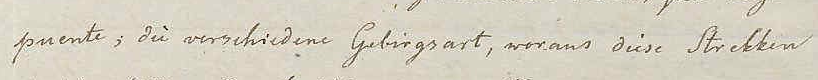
puente; die verschiedene Gebirgsart, woraus diese Strekken
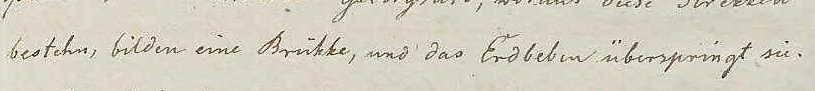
bestehn, bilden eine Brükke, und das Erdbeben überspringt sie.
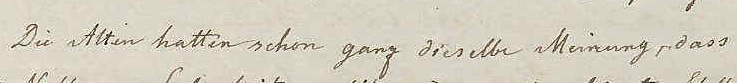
Die Alten hatten schon ganz dieselbe Meinung, dass
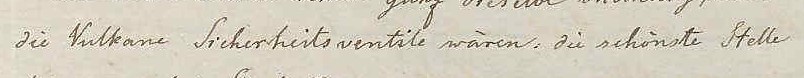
die Vulkane Sicherheitsventile wären: die schönste Stelle
